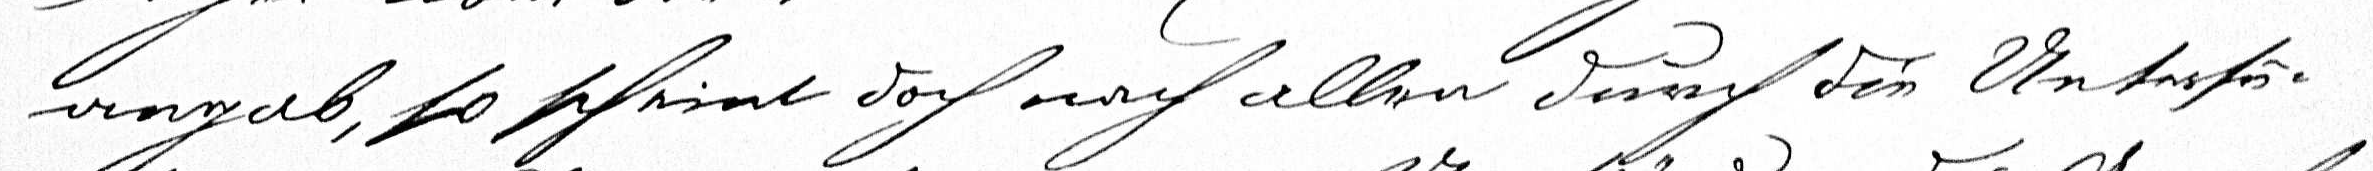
angab, so scheint doch nach allen durch die Untersu¬
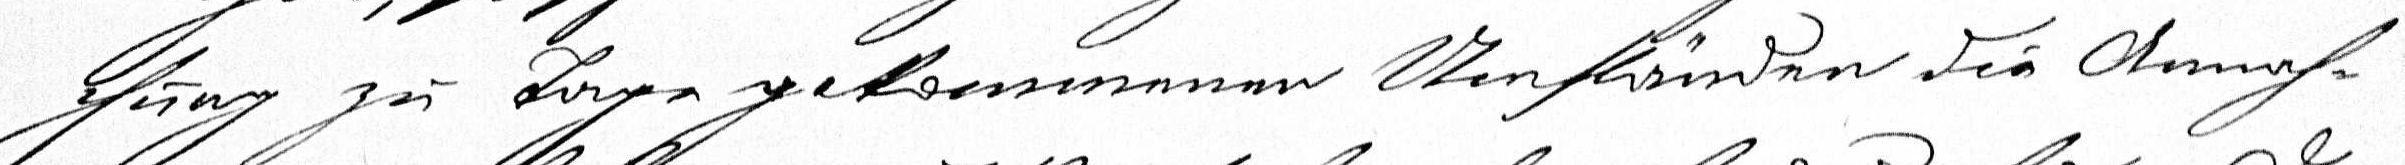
chung zu Tage gekommenen Umständen die Annah¬
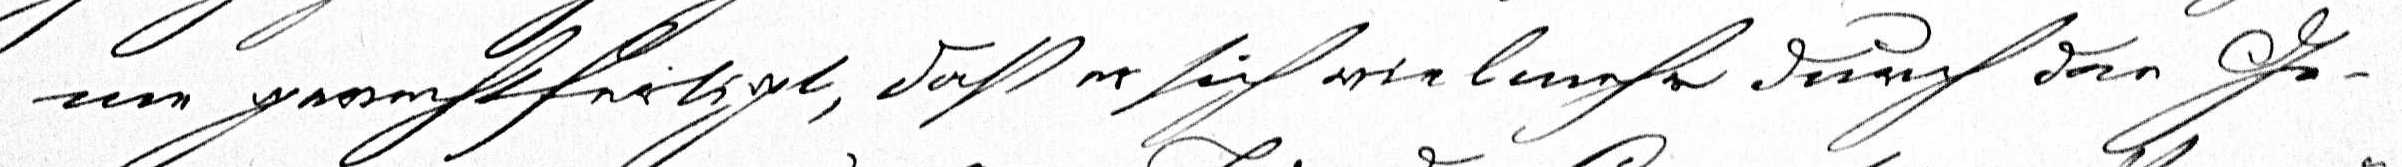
me gerechtfertigt, daß er sich vielmehr durch den Ge¬
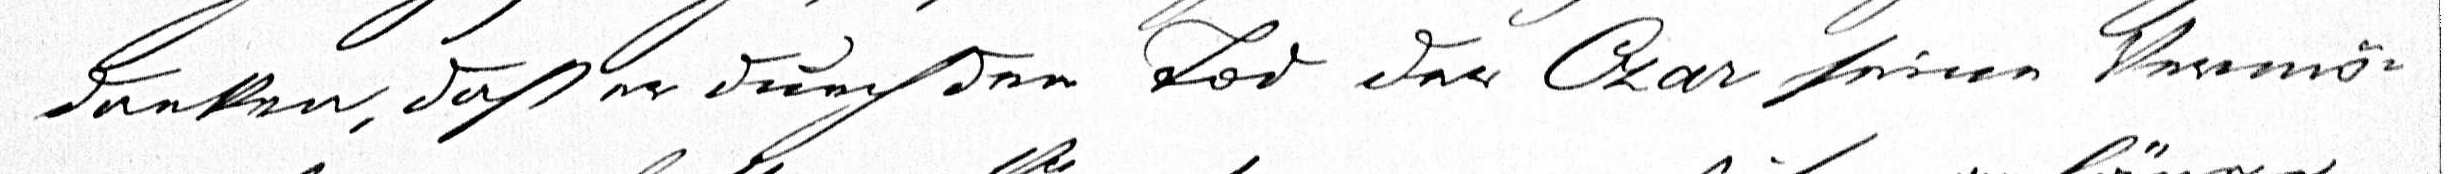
danken, daß er durch den Tod der Czar seine Vermö¬
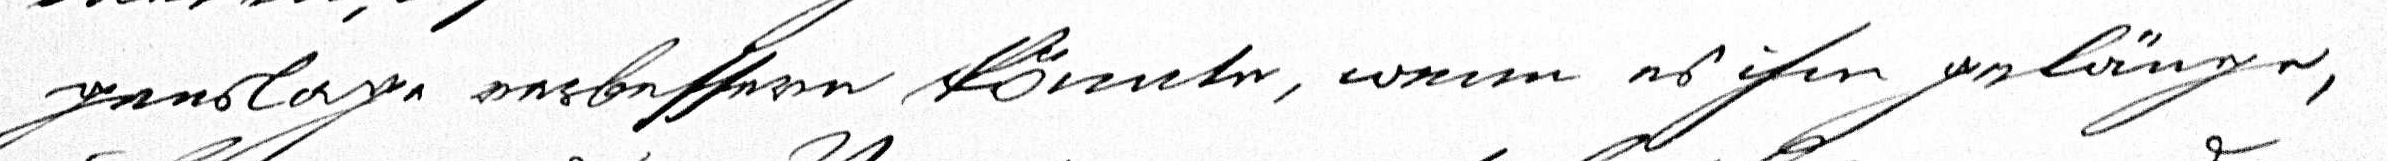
genslage verbessern könnte, wenn es ihm gelänge,
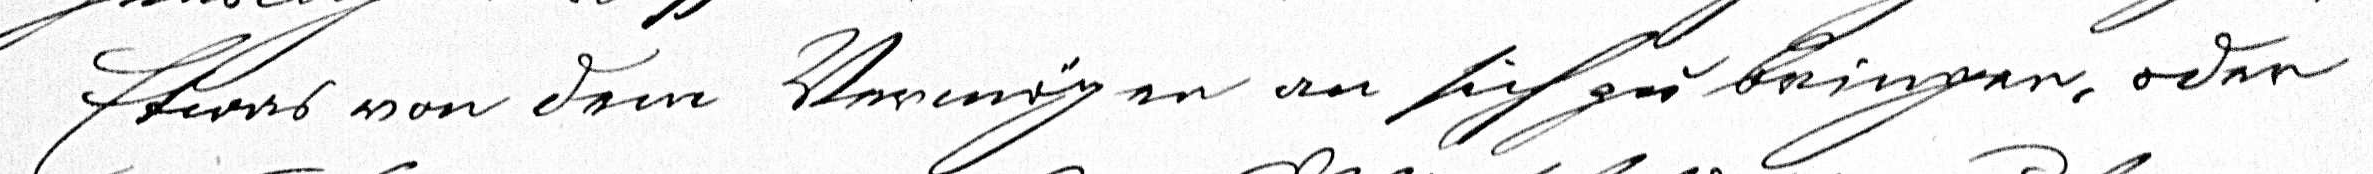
Etwas von dem Vermögen an sich zu bringen, oder
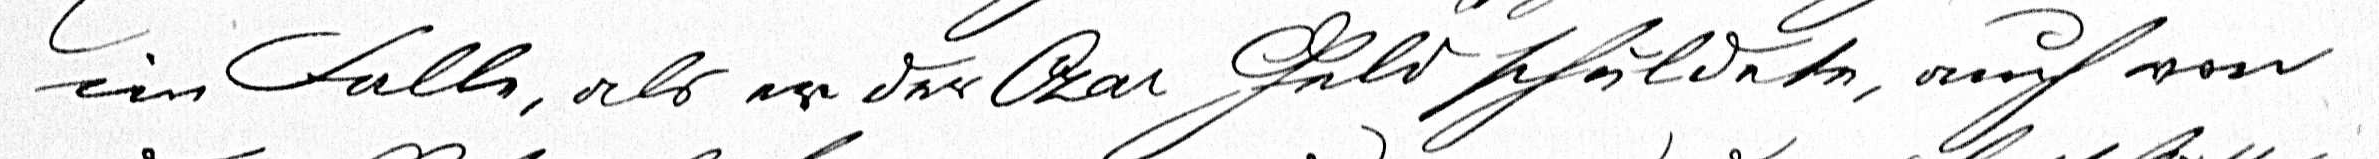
im Falle, als er der Czar Geld schuldete, auch von
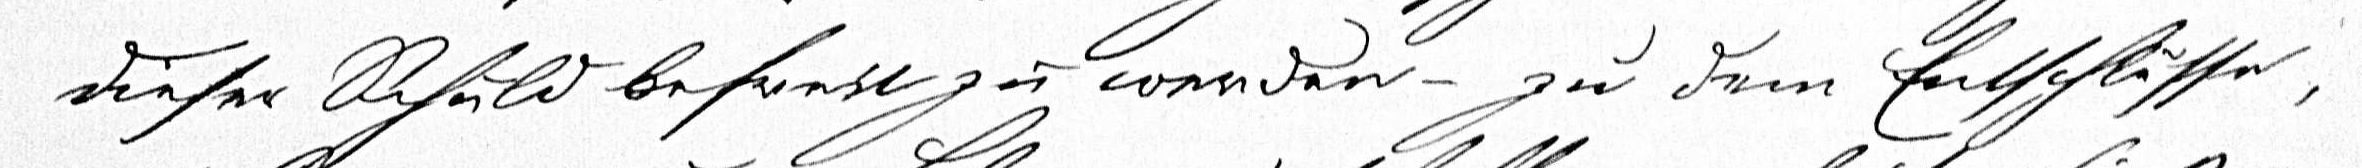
dieser Schuld befreit zu werden – zu dem Entschlüsse,
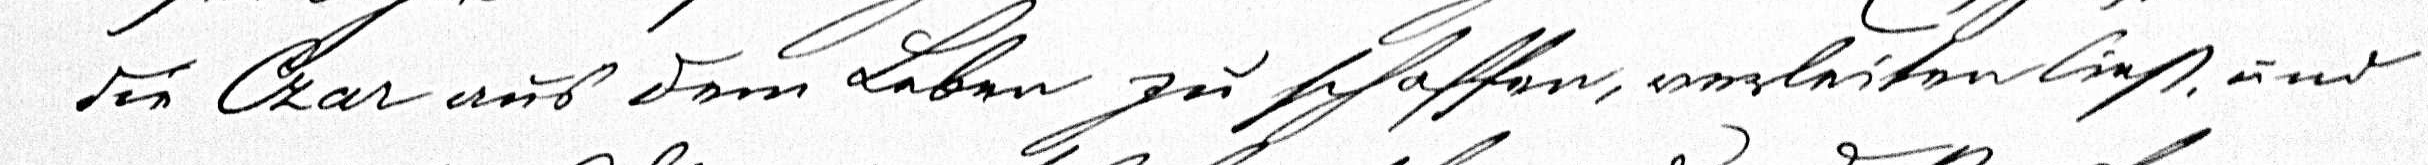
die Czar aus dem Leben zu schaffen, verleiten ließ, und
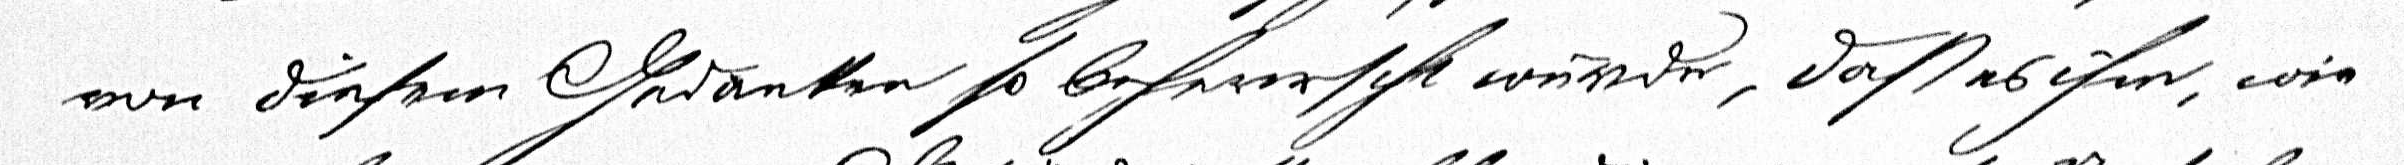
von diesem Gedanken so beherrscht wurde, daß es ihm, wie
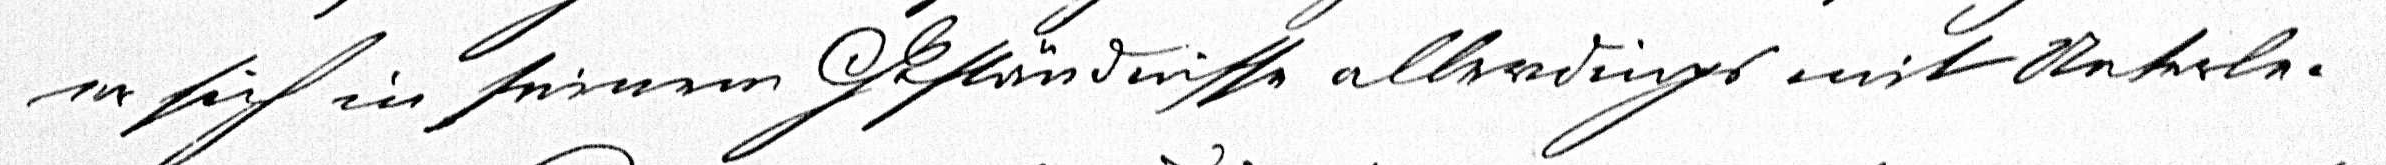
er sich in seinem Geständnisse allerdings mit Unterle¬
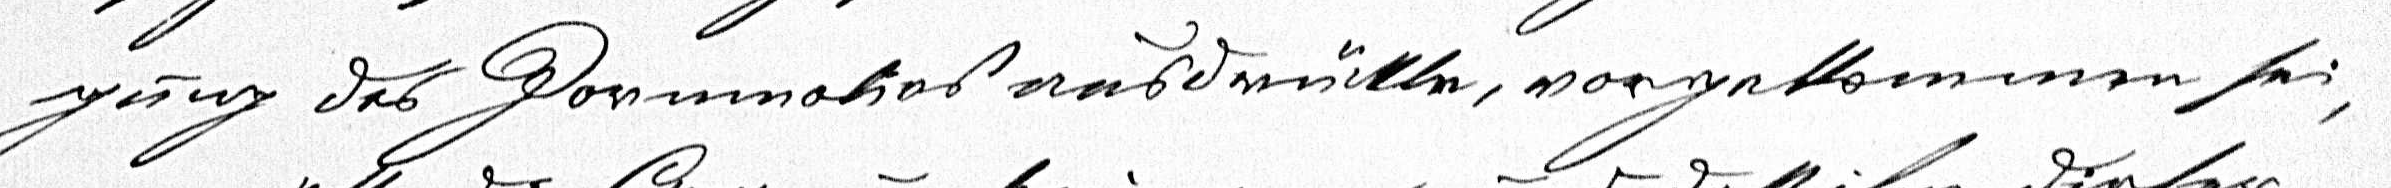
gung des Zornmotives ausdrückte, vorgekommen sei,
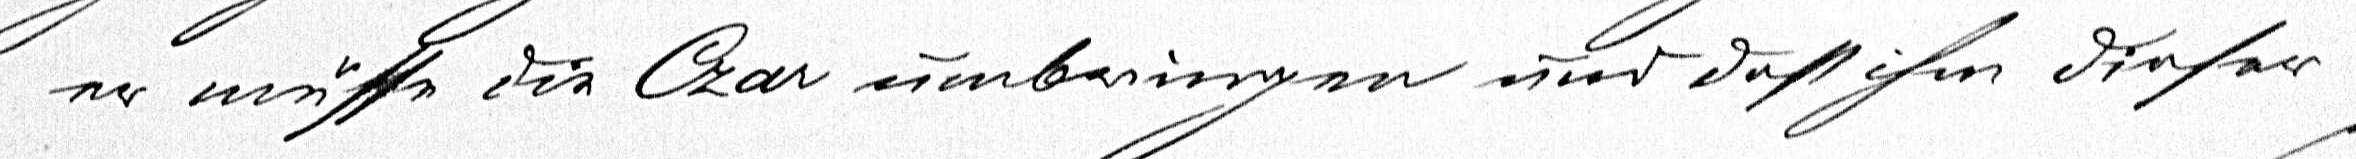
er müsse die Czar umbringen und daß ihm dieser
